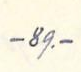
89
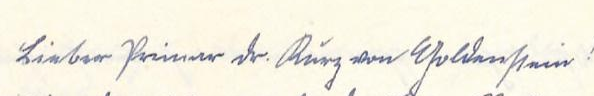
Lieber Primar Dr. Kurz von Goldenstein
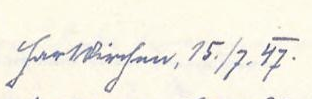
Hartkirchen, 15./7 47.
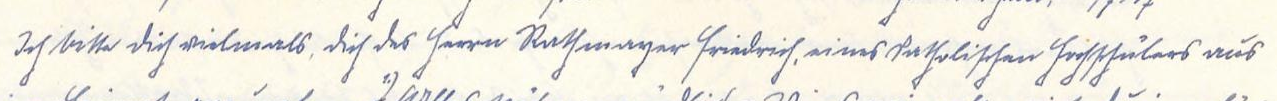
Ich bitte dich vielmals, dich des Hern Rathmayer Fridrich, eines kaholischen Hochschülers aus
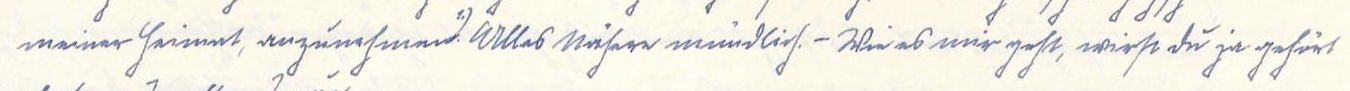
meiner Heimat, anzunehmen. Alles nähere mündlich - Wie es mir geht, wirst du ja gehört
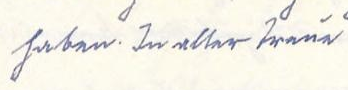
haben. In alter Treue
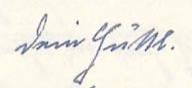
Dein
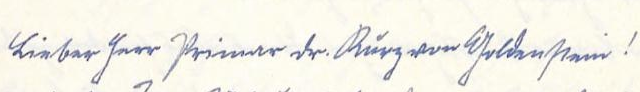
Lieber Herr Primar Dr. Kurz von Goldenstein!
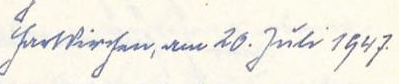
Hartkirchen, am 20. Juli 1947.
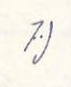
7)
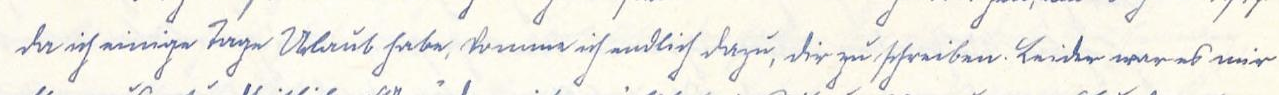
Da ich einige Tage Urlaub habe, konmme ich endlich dazu, dir zu schreiben. Leider war es mir
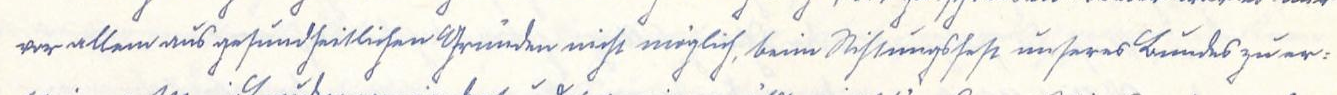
vor allem aus gesundheitlichen Gründen nicht möglich, beim Stiftungsfest unseres Bundes zu er-
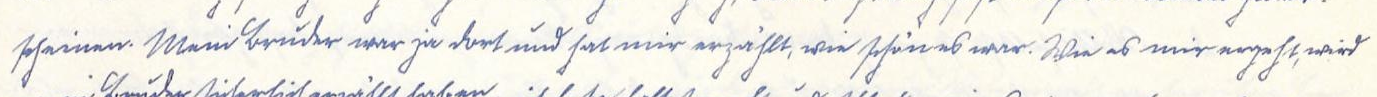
scheinen. Mein Bruder war ja dort und hat mir erzählt, wie schön es war. Wie es mir ergeht, wird
